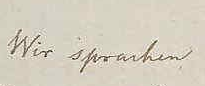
Wir sprachen
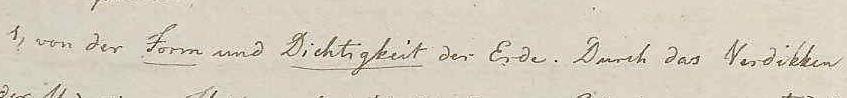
1, von der Form und Dichtigkeit der Erde. Durch das Verdikken
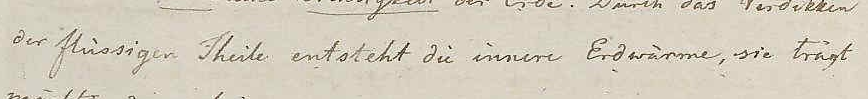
der flüssigen Theile entsteht die innere Erdwärme, sie trägt
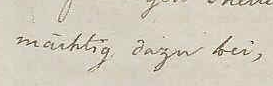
mächtig dazu bei,
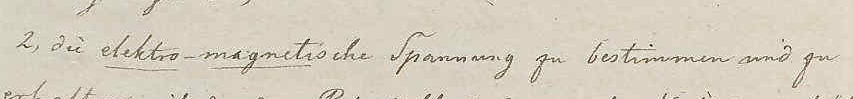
2, die elektro-magnetische Spannung zu bestimmen und zu
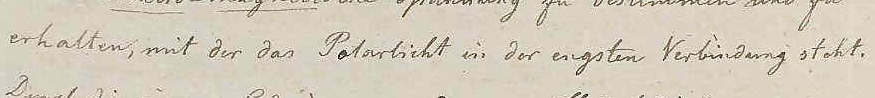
erhalten, mit der das Polarlicht in der engsten Verbindung steht.
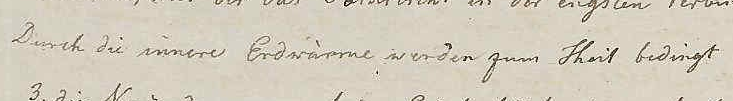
Durch die innere Erdwärme werden zum Theil bedingt
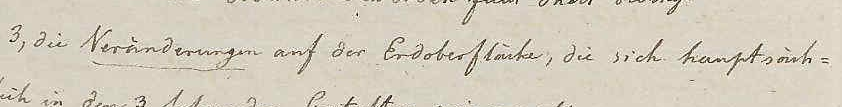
3, die Veränderungen auf der Erdoberfläche, die sich hauptsäch-
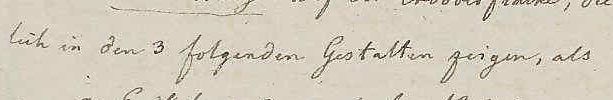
lich in den 3 folgenden Gestalten zeigen, als
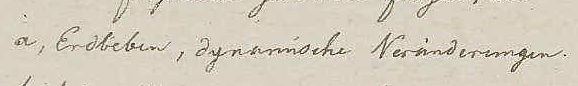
a, Erdbeben, dynamische Veränderungen.
